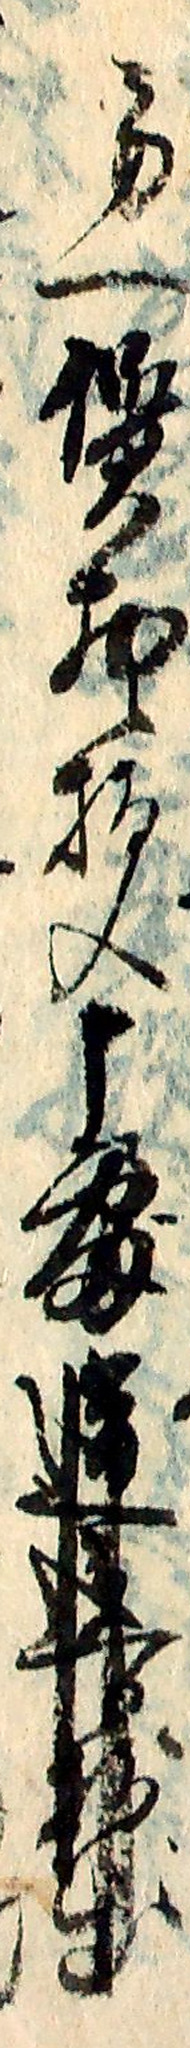芳一質物に指入申処道送り指出
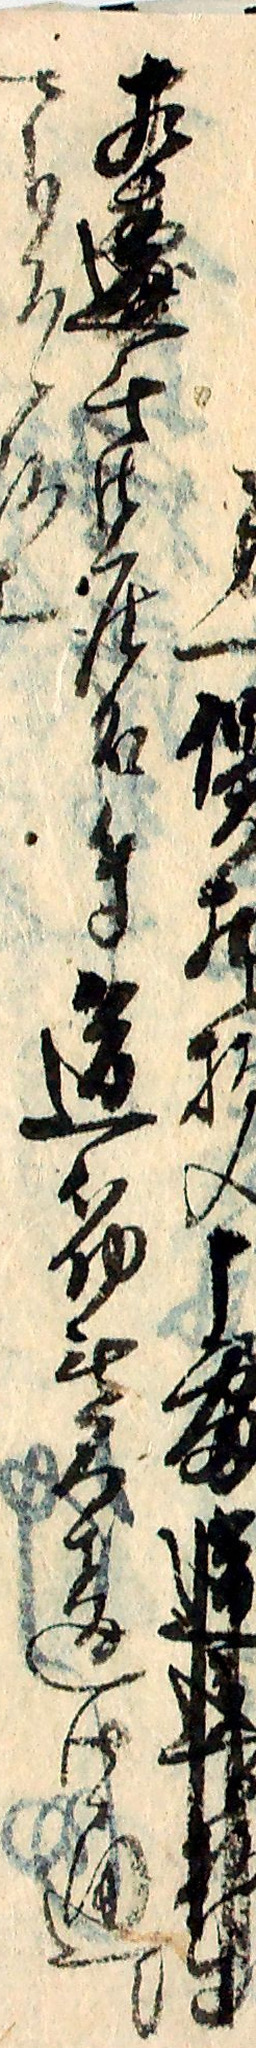相違無御座候付道筋無間違御通し
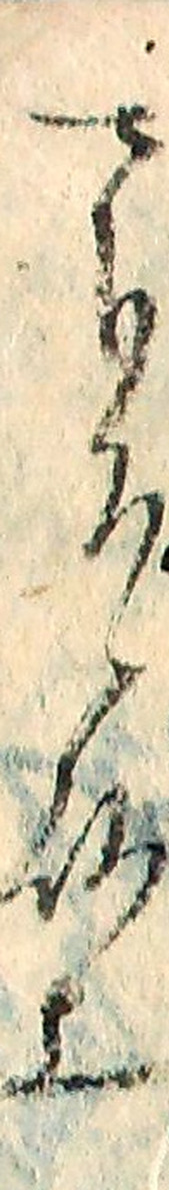可被下候以上

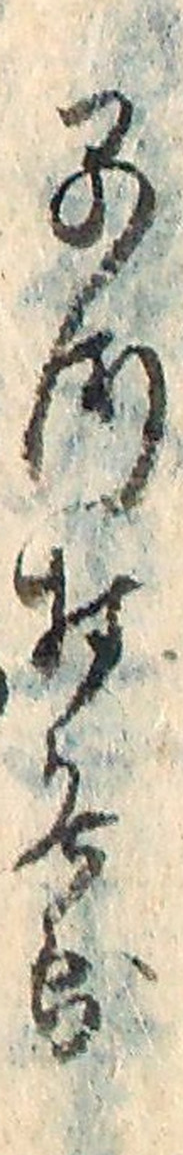早淵村庄屋
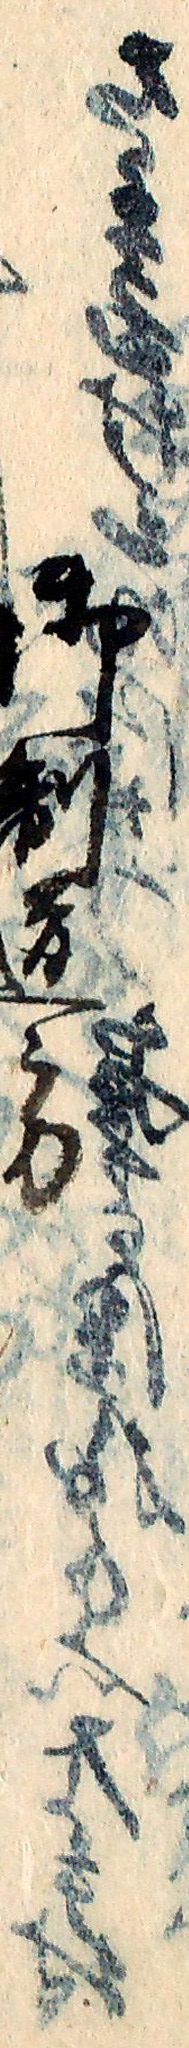御制道方
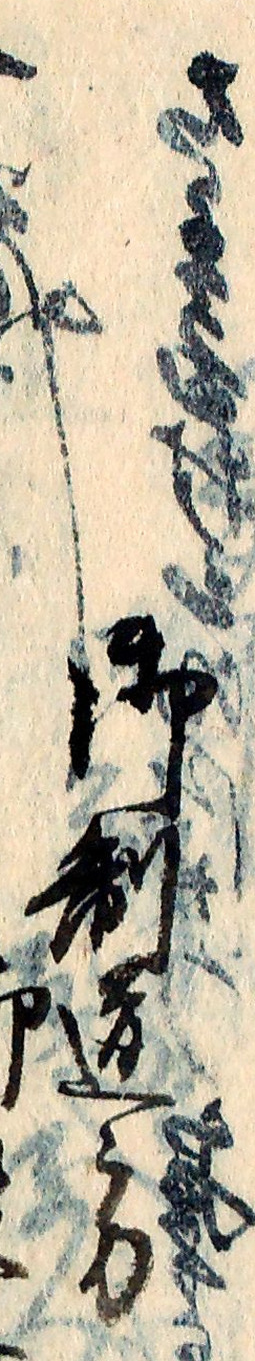御制道方
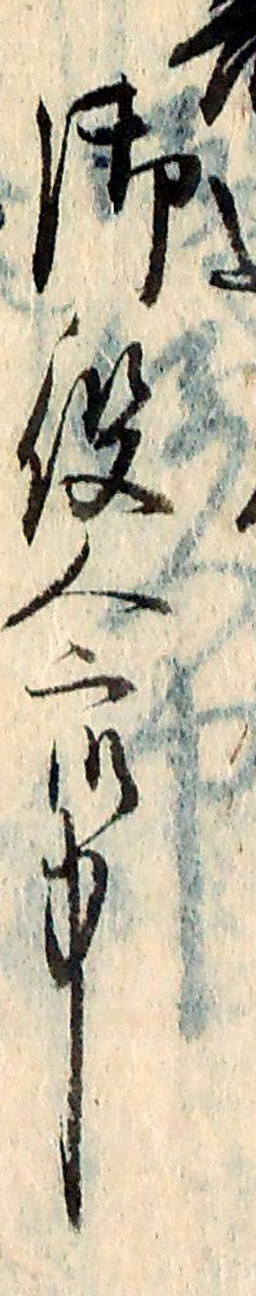御役人衆中

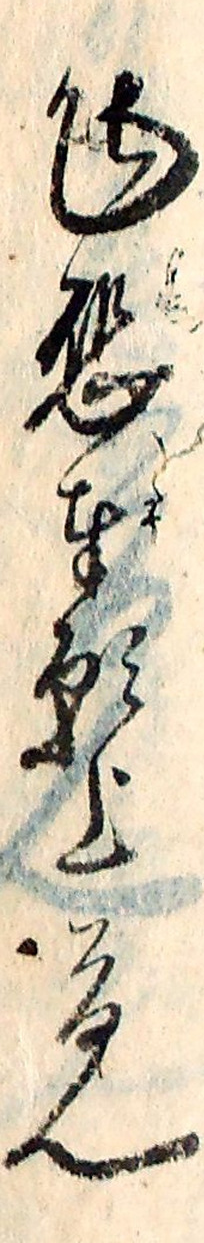乍恐奉願上覚
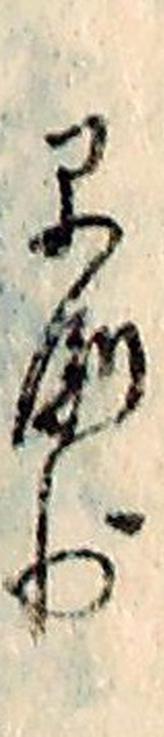早淵村
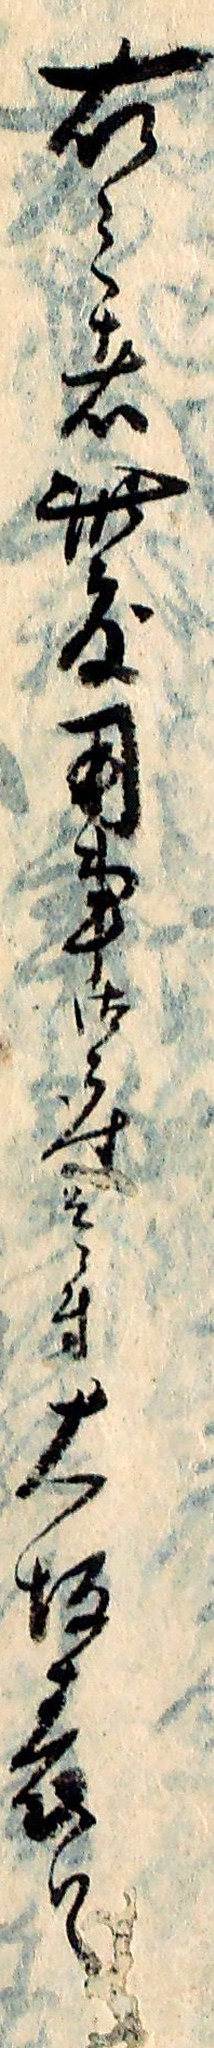右之者此度用事御座候に付大坂表え
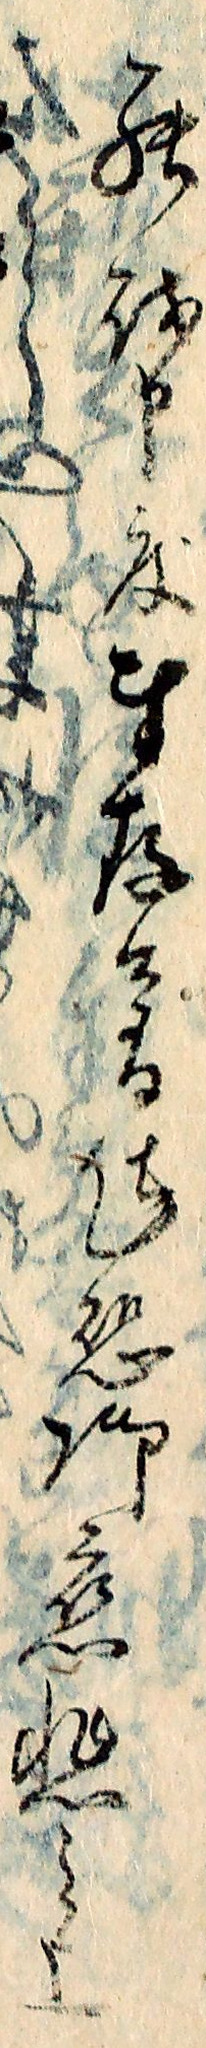罷越申度奉存候間乍恐御慈悲之上
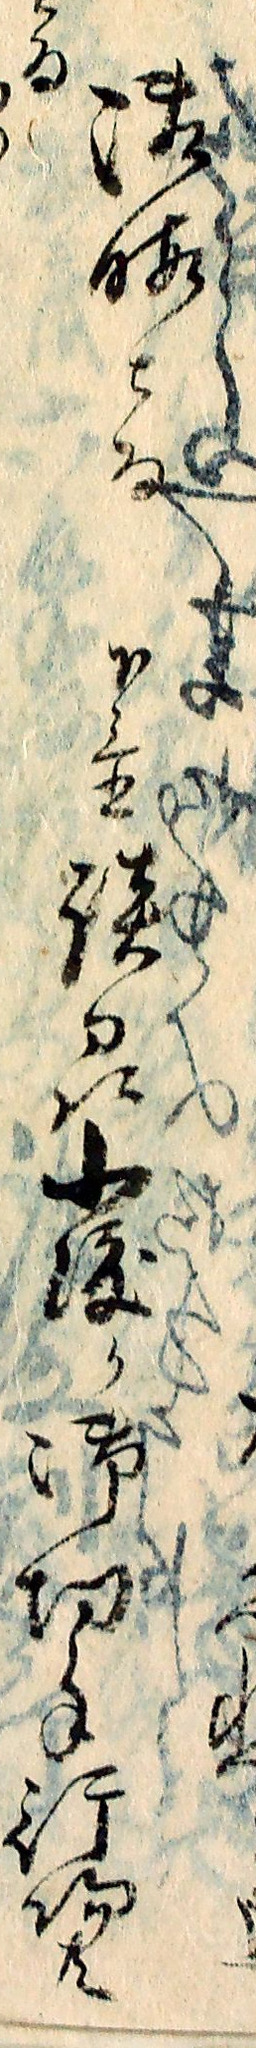御暇被為下置淡州小渡り御切手行場共
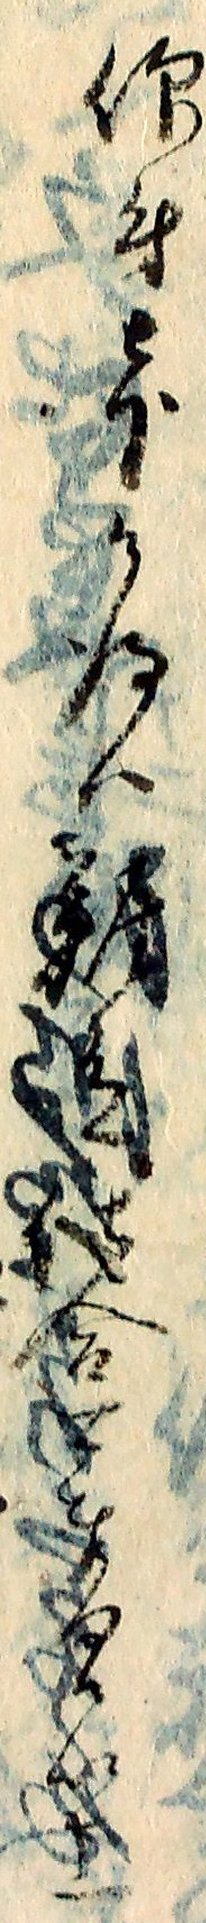被為仰付被下候得は難有仕合可奉存候以上
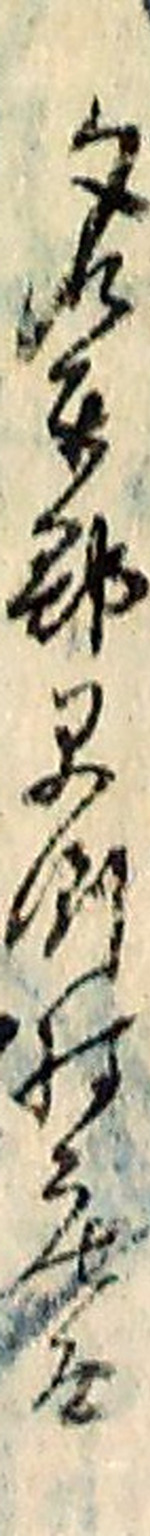名東郡早淵村庄屋
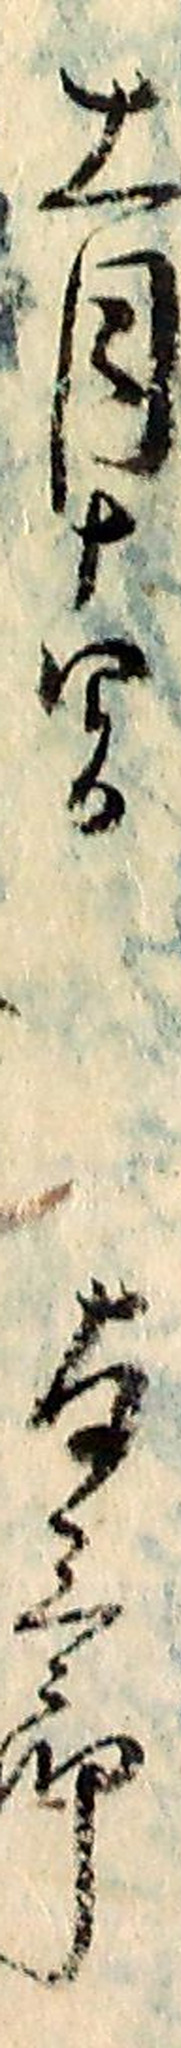十一月十四日与三郎
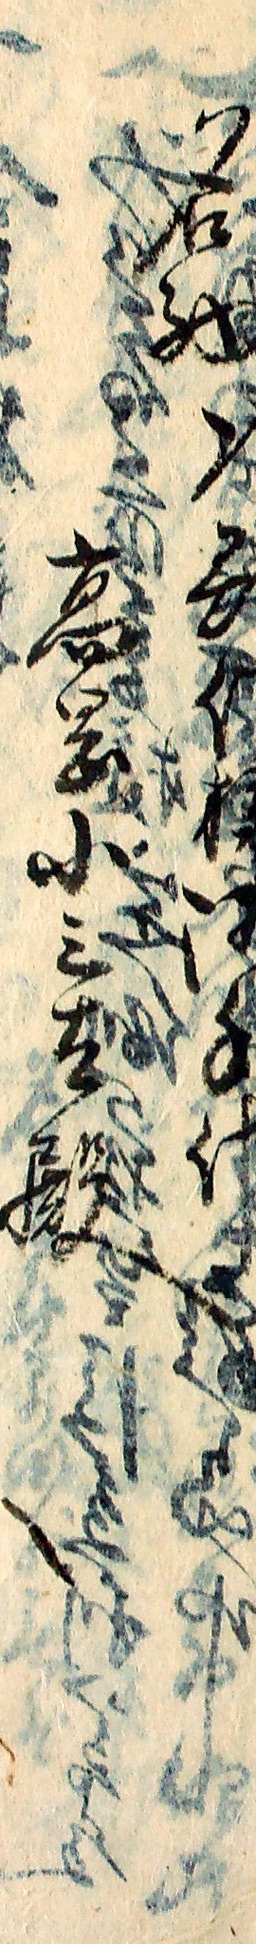高岡小三太殿
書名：諸御願書控(後藤氏壱番）
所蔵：鳴門教育大学 Naruto University of Education
